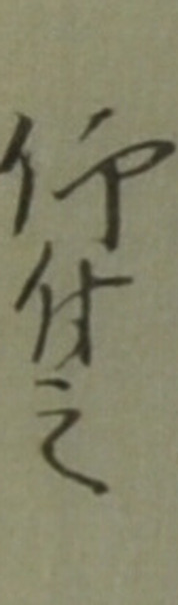仰付之

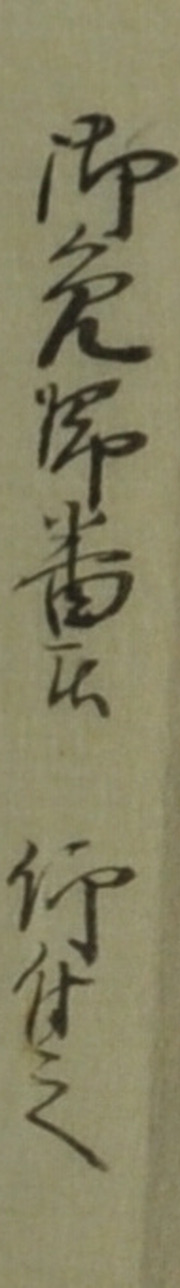御免帰番被仰付之
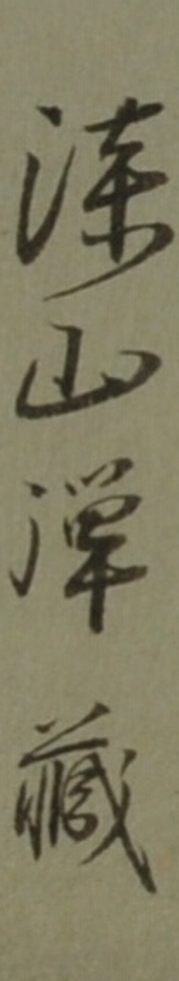漆山弾蔵
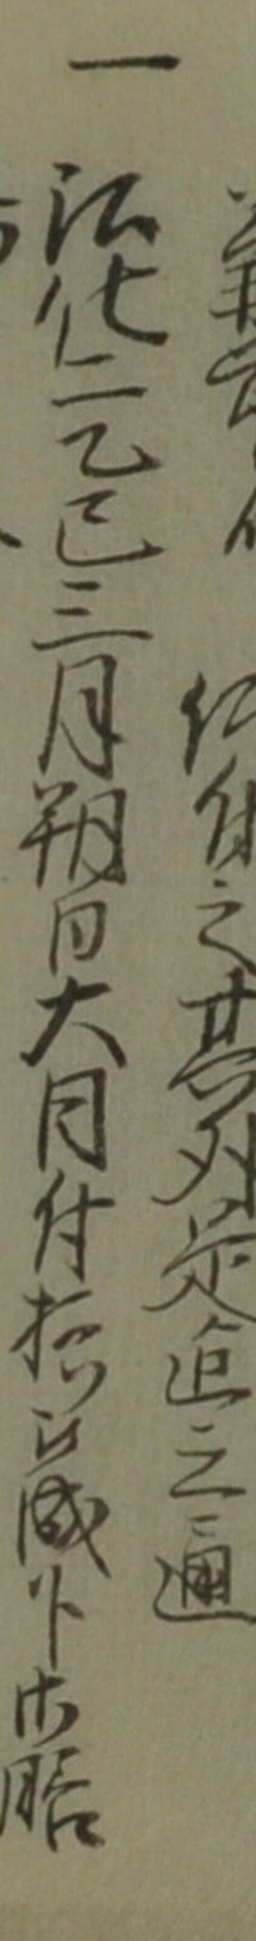一弘化二乙巳三月朔日大目付格被成下御膳
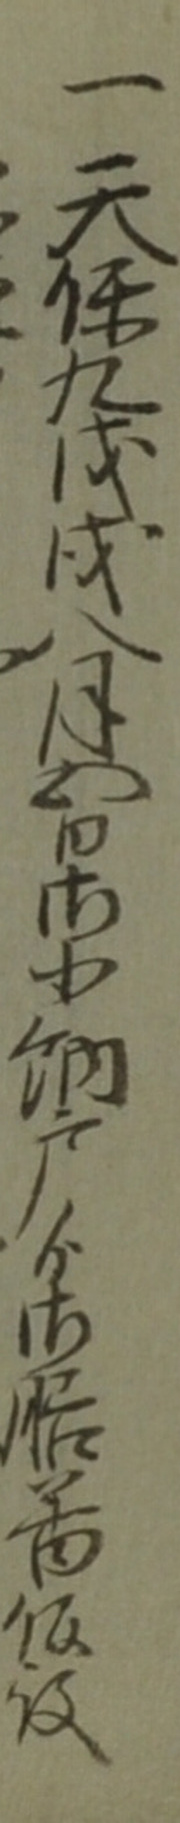一天保九戊戌八月五日御小納戸ゟ御膳番仮役
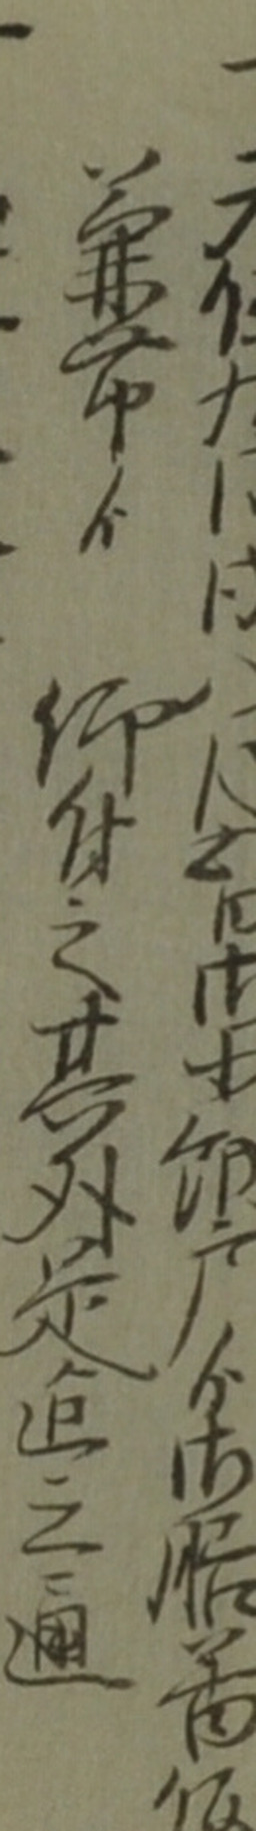兼帯ゟ仰付之其外是迄之通
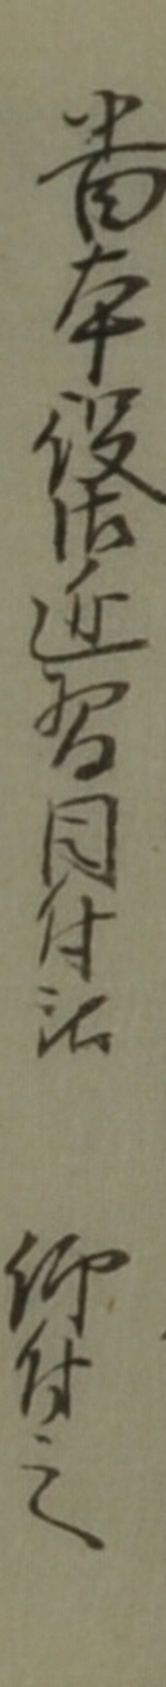番本役御近習目付被仰付之
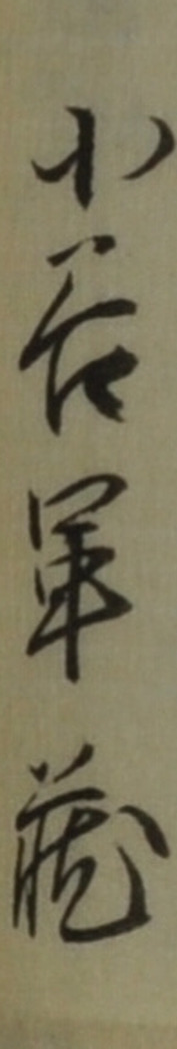小谷軍蔵
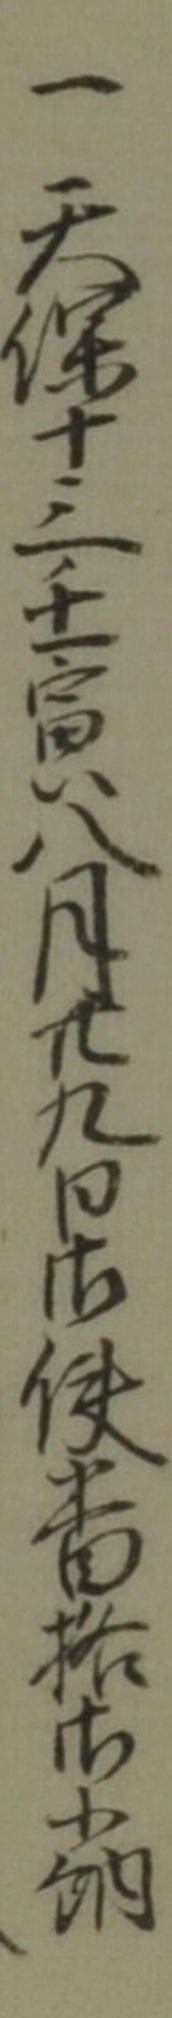一天保十三壬寅八月廿九日御使番格御小納
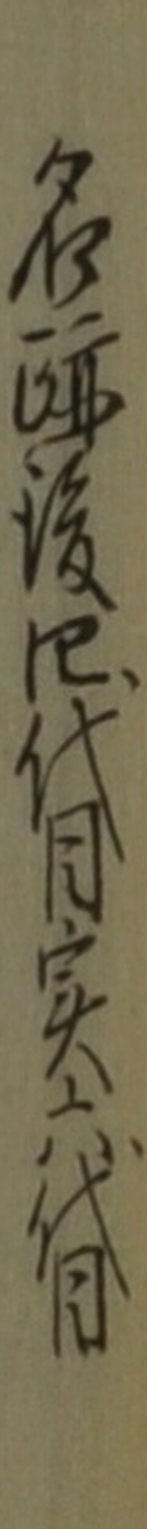名跡後四代目実六代目
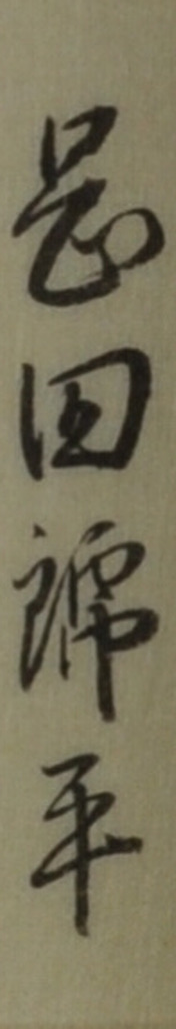岡田錦平
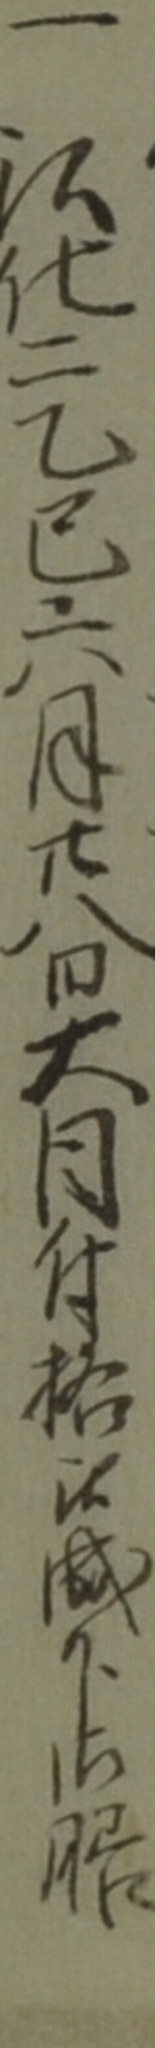一弘化二乙巳六月廿八日大目付格被成下御膳
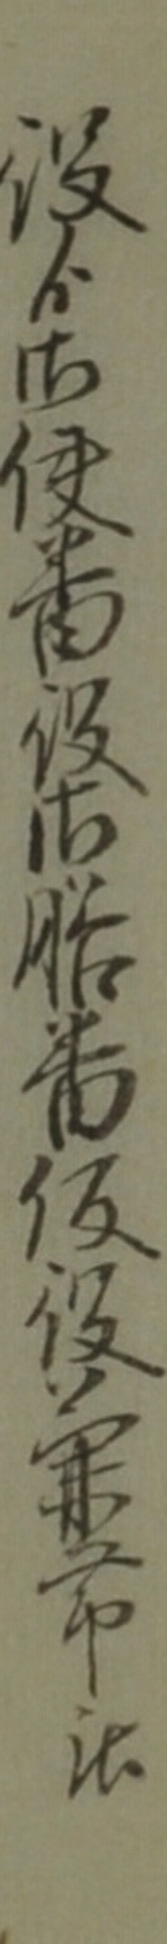役ゟ御使番役御膳番仮役兼帯被
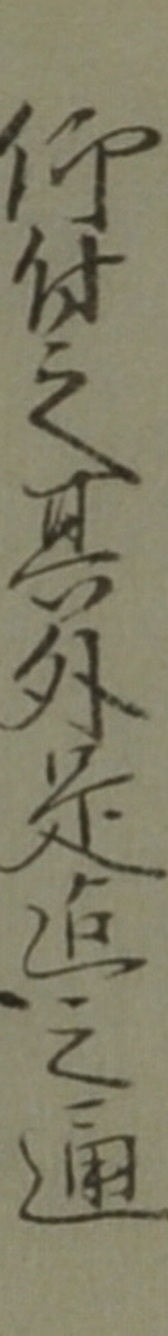仰付之其外是迄之通
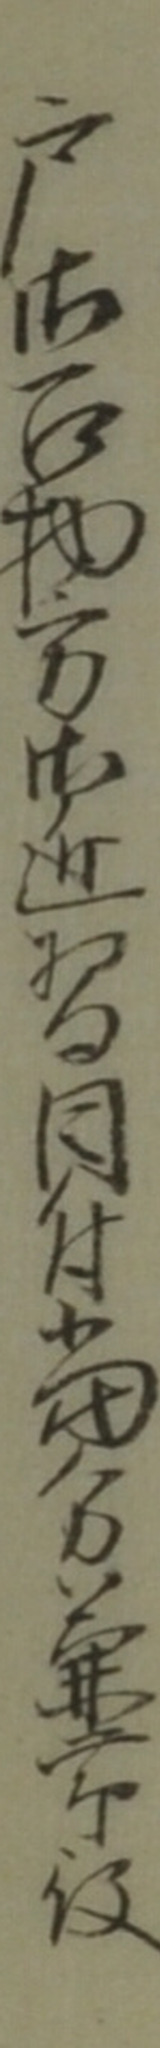戸御召物方御近習目付当分兼帯役
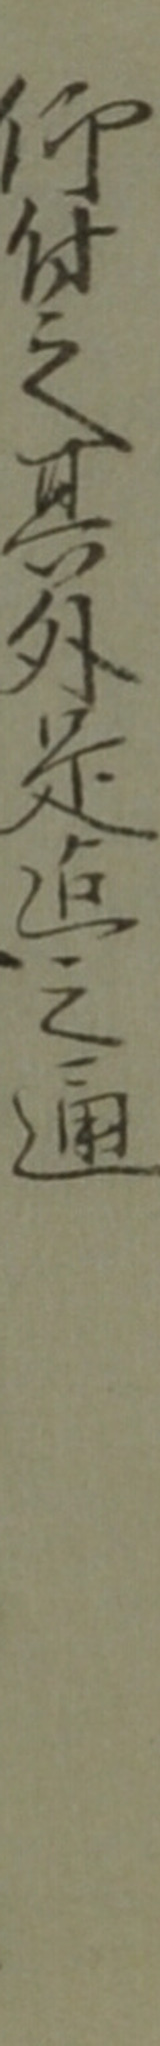仰付之其外是迄之通
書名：諸御役代々録（四）
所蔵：伊那市立高遠町図書館・合同会社AMANE
